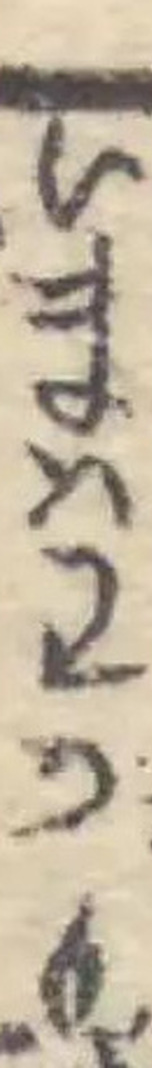いまはわか
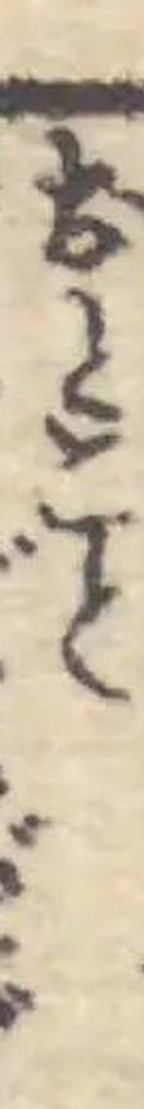おとこと
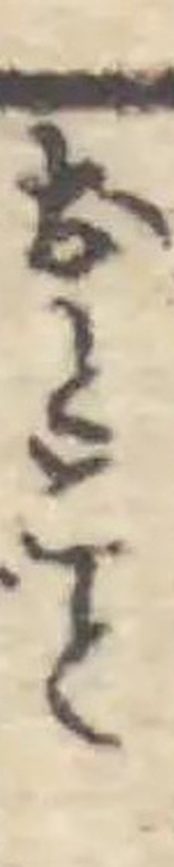おとこと
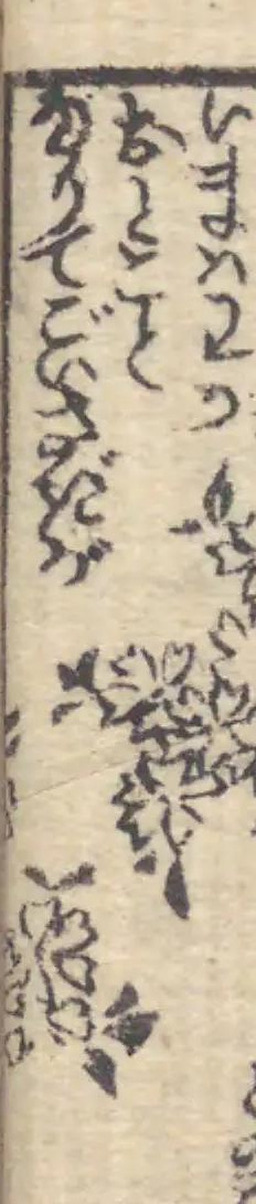なりてごいさぎが
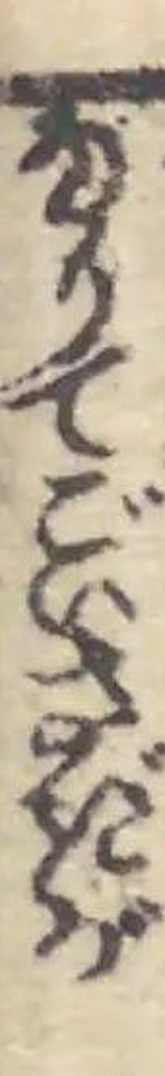なりてごいさぎが
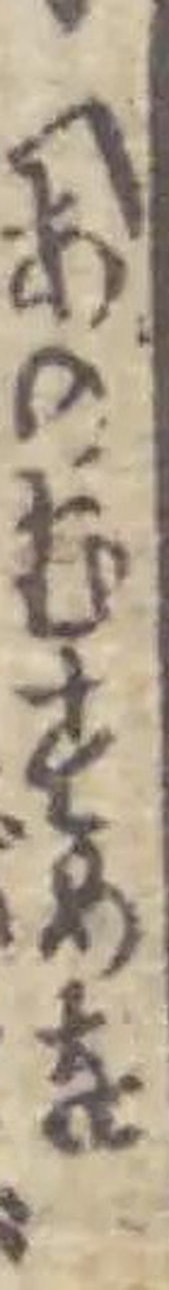〽あのむすめを
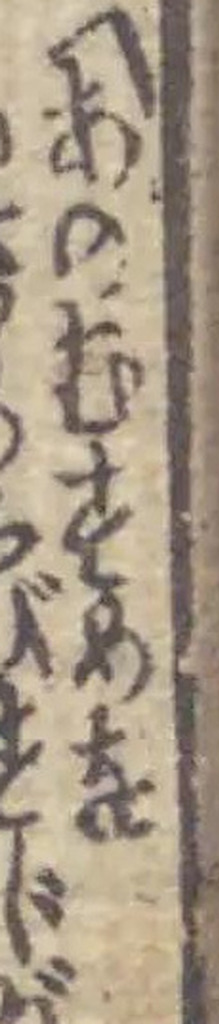〽あのむすめを
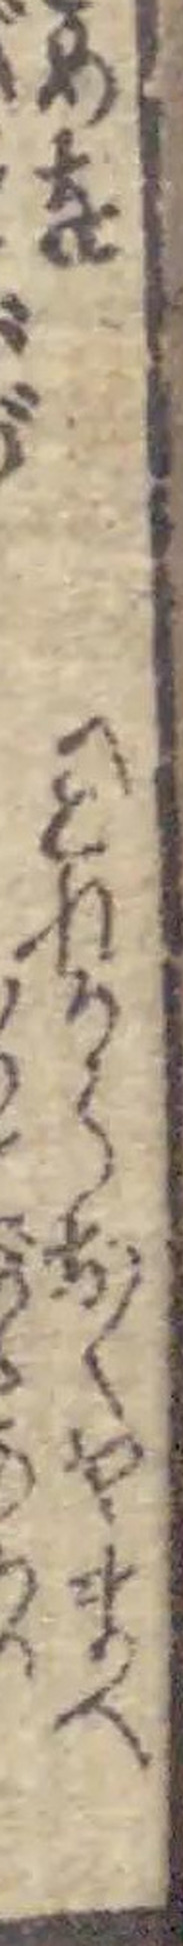〽これからおくやまへ
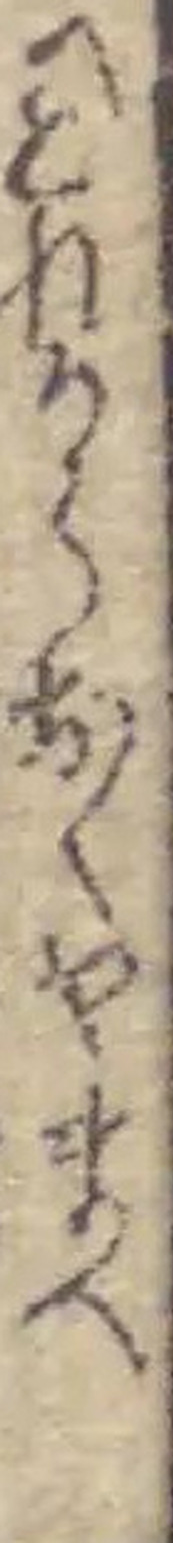〽これからおくやまへ
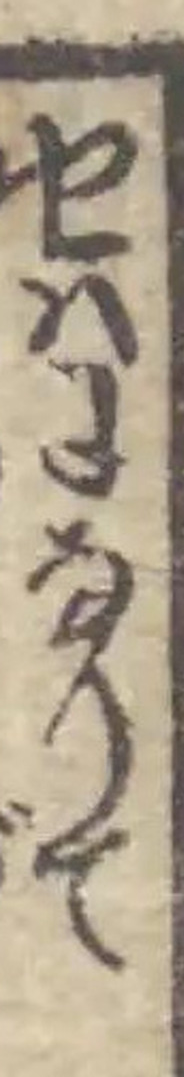せはになりて
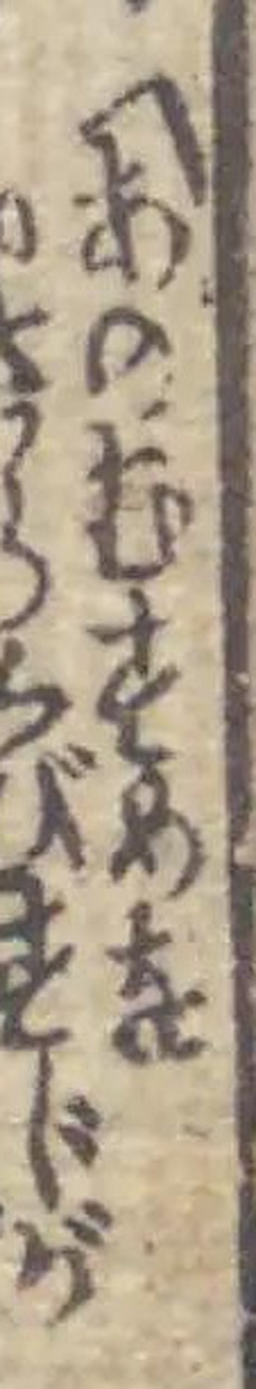〽あのむすめを
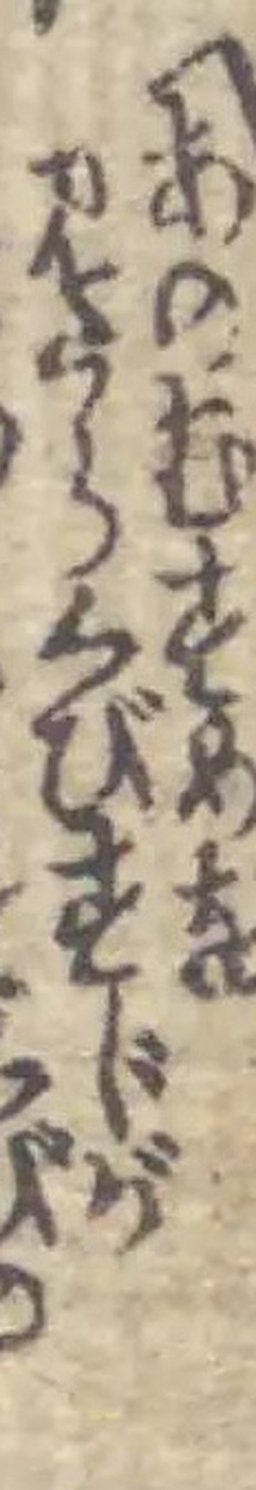見たらくびすじが
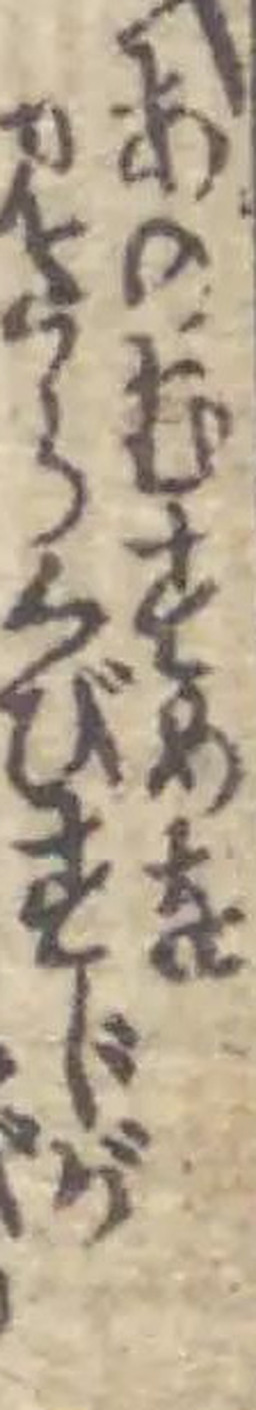見たらくびすじが
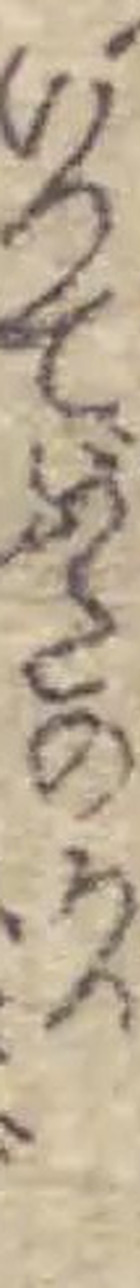いつてぶたのかつ
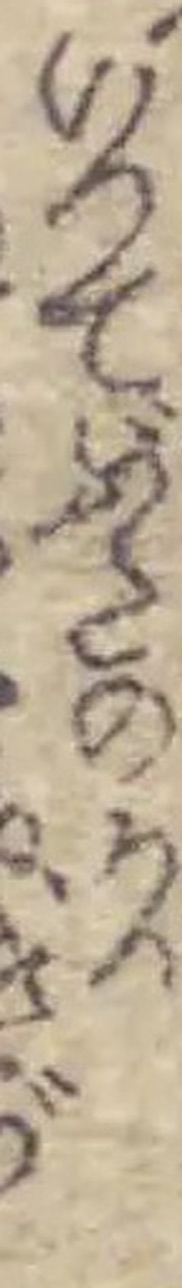いつてぶたのかつ
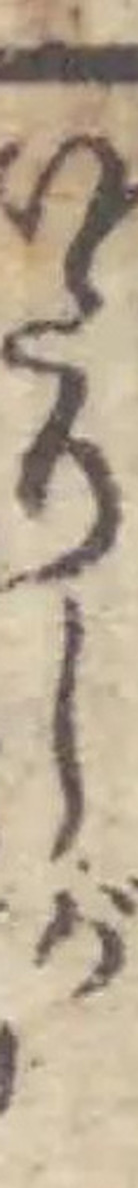いたりしが
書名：化物尽 4巻
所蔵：国立国会図書館 National Diet Library, JAPAN
